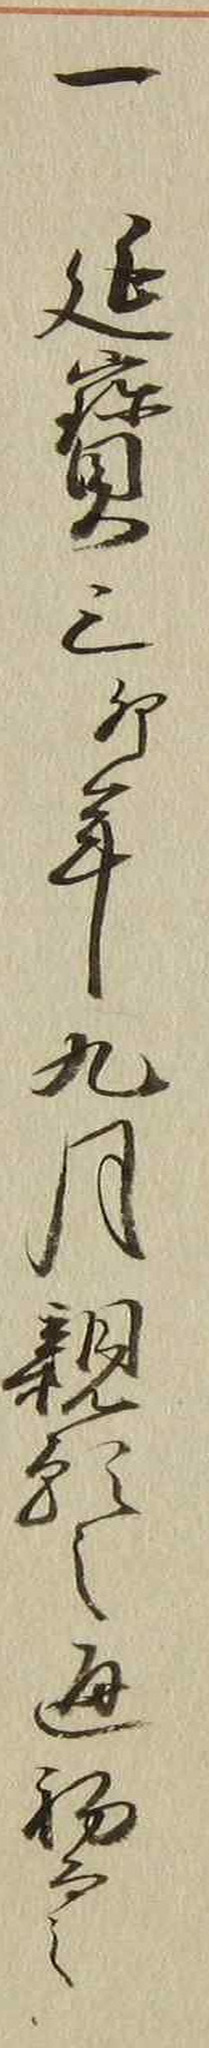一延宝三卯年九月親願之通初而之
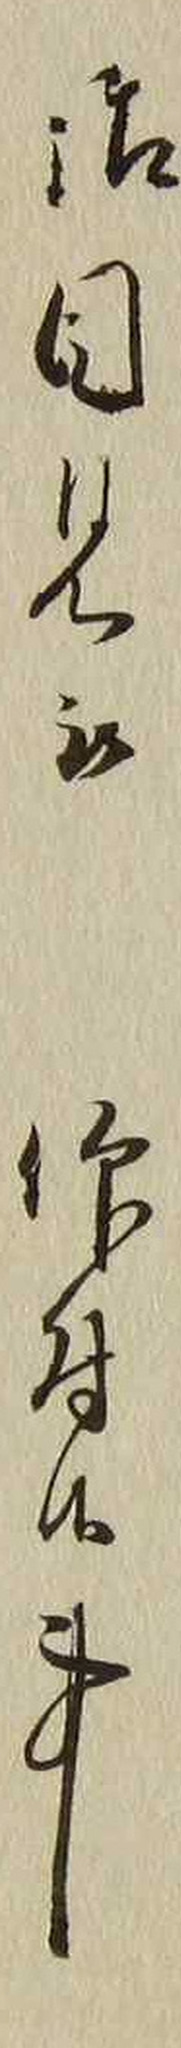御目見被仰付候事
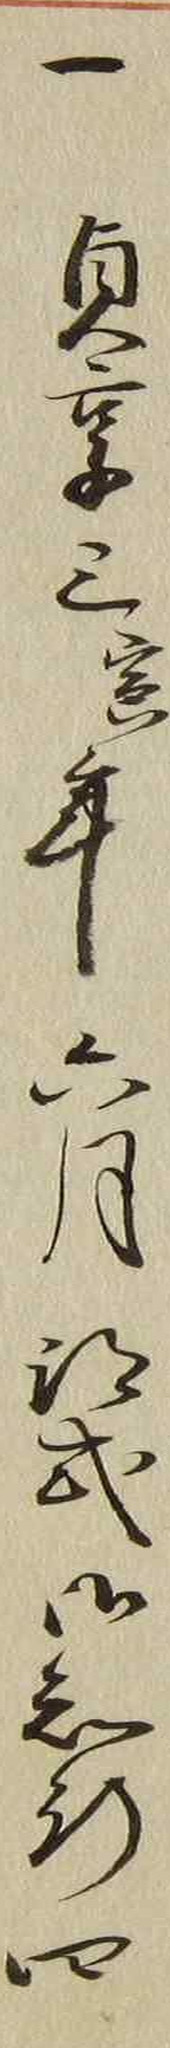一貞享三寅年六月跡式御知行四
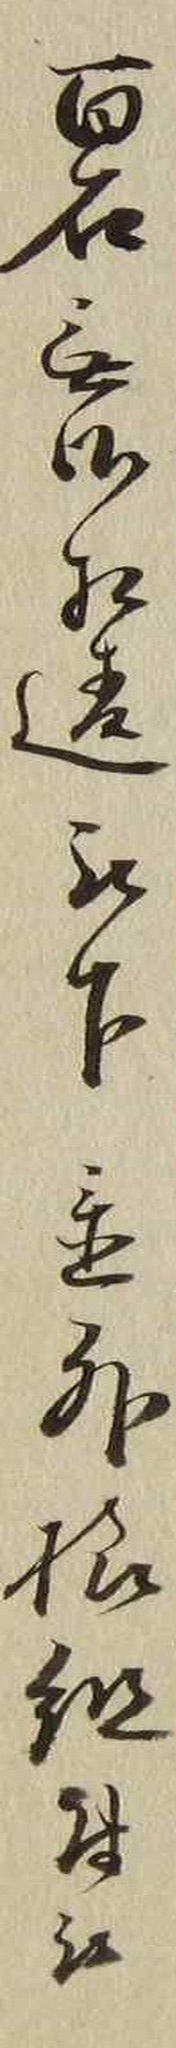百石無御相違被下置外様組付被
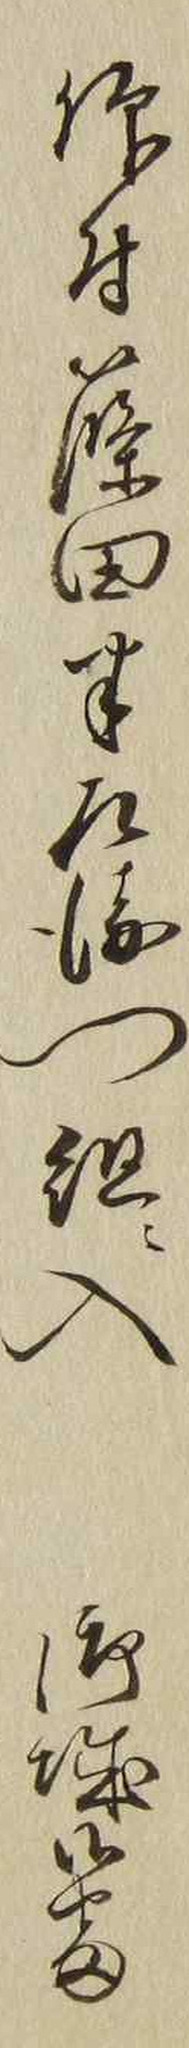仰付篠田半左衛門組ニ入御城御番
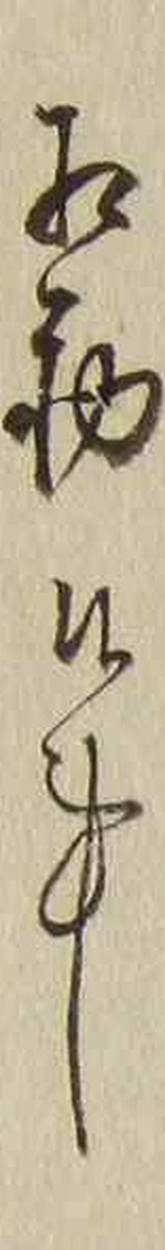相勤候事

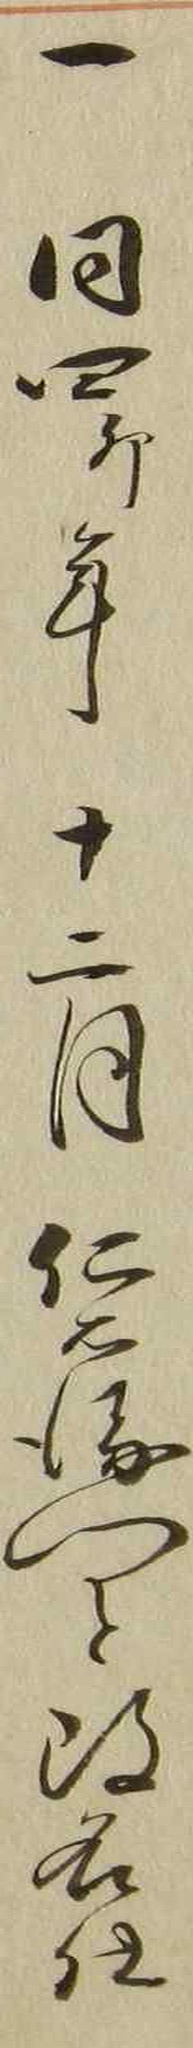一同四卯年十二月仁右衛門と改名仕
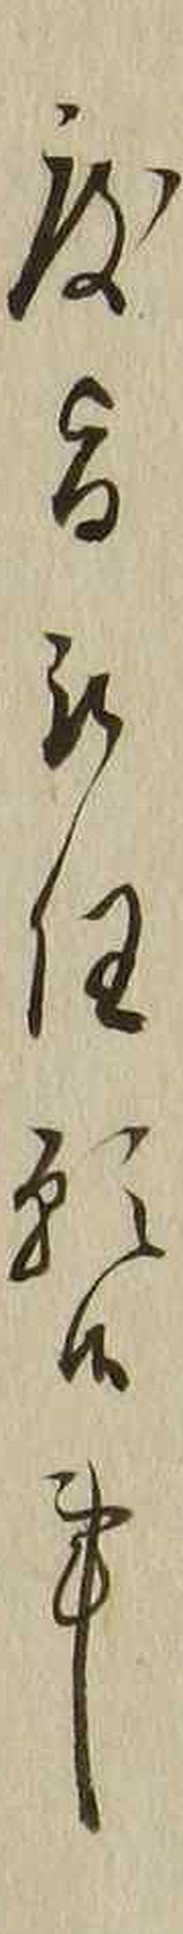度旨被任願候事
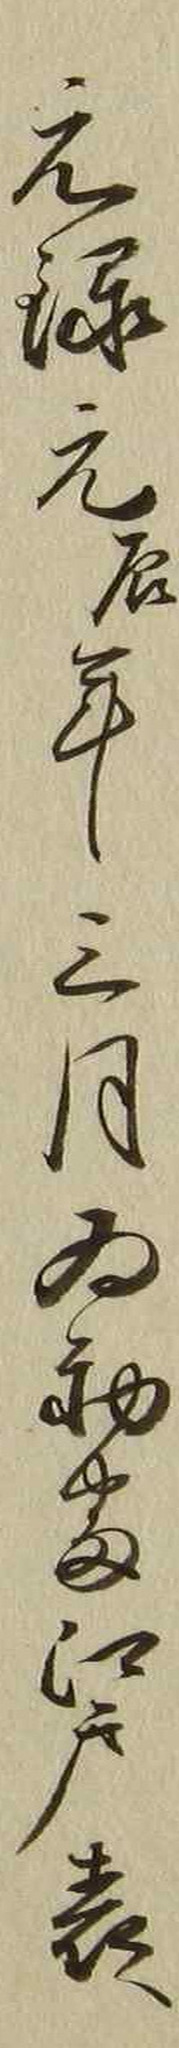一元禄元辰年三月為勤番江戸表ヘ
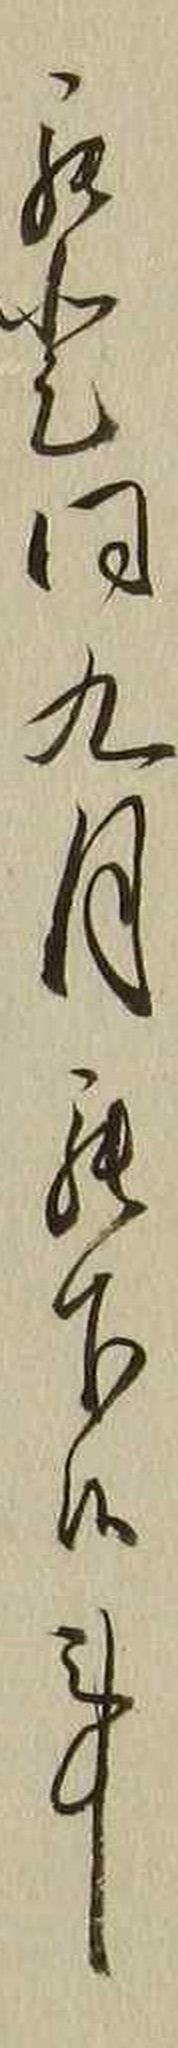罷登同九月罷下候事
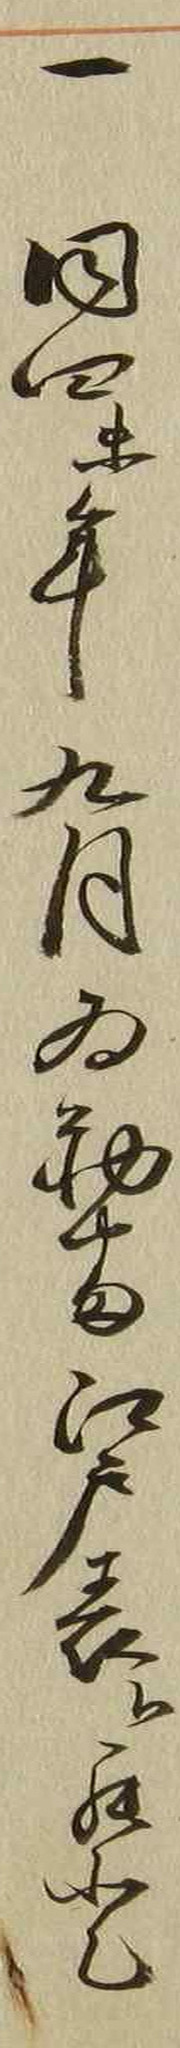一同四未年九月為勤番江戸表江罷登
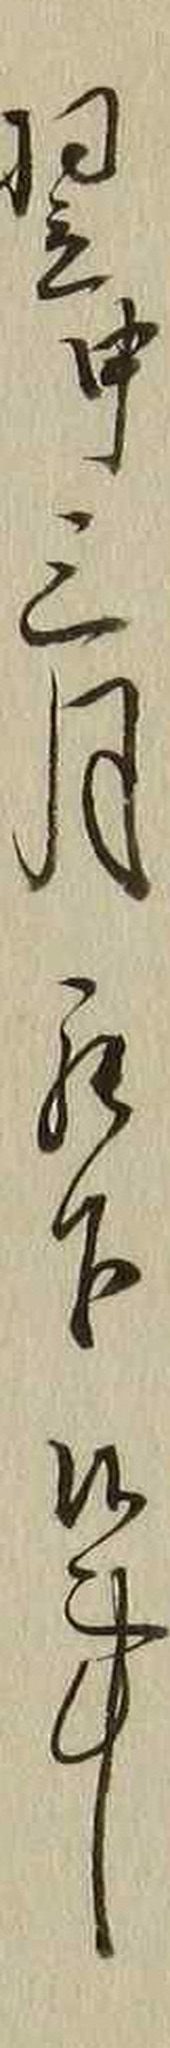翌申年三月罷下候事
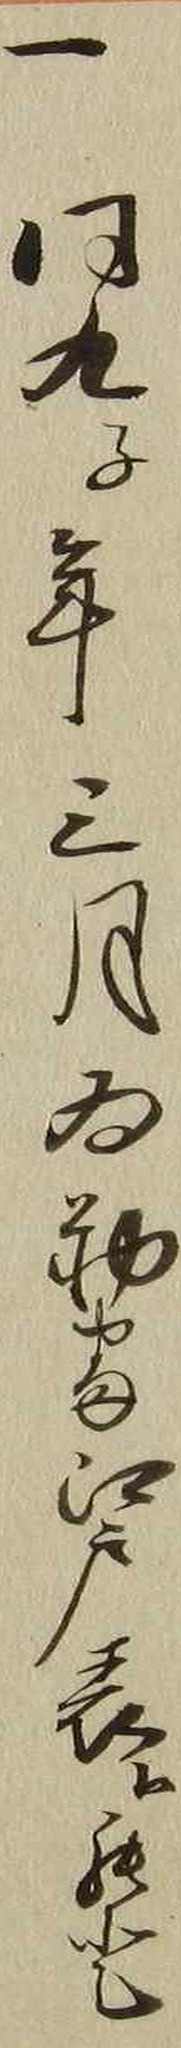一同九子年三月為勤番江戸表江罷登
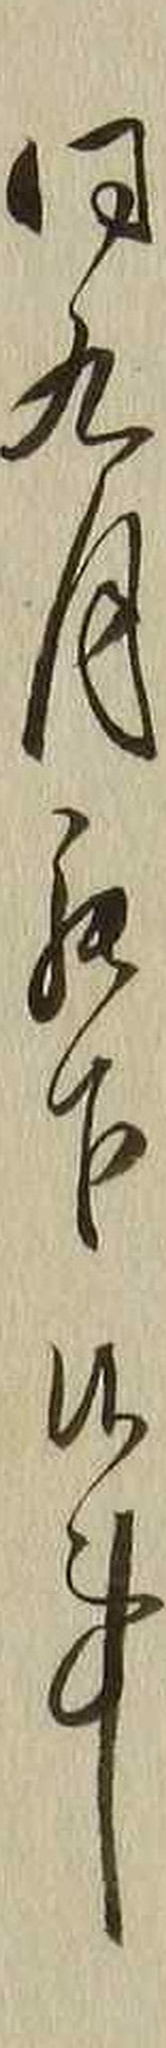同九月罷下候事
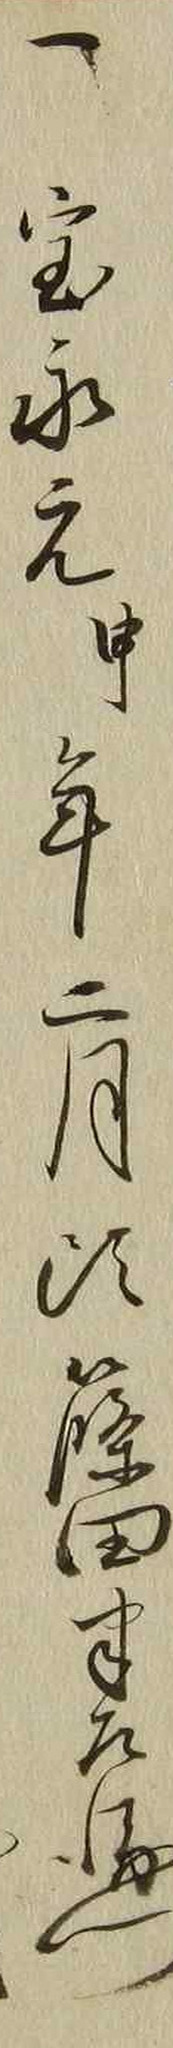一宝永元申年二月頭篠田半左衛門
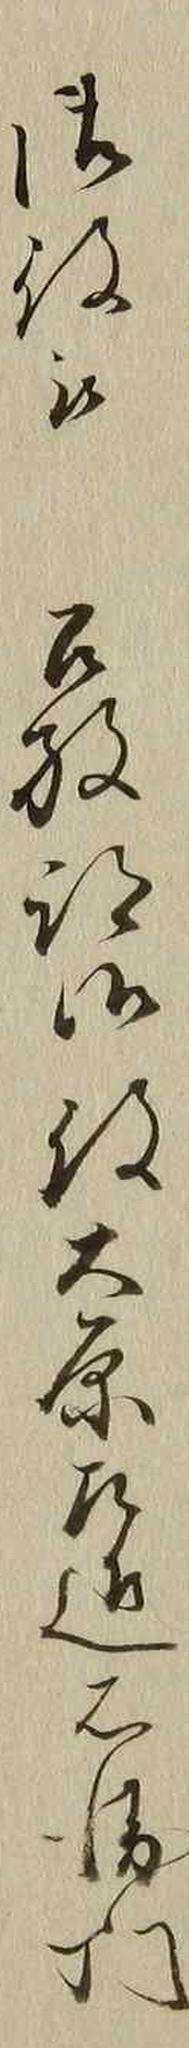御役被召放跡御役大原左近右衛門
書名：諸士系譜　巻之68　を之部2
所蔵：会津若松市立会津図書館
